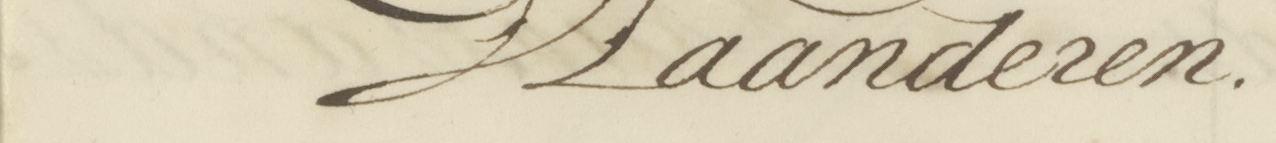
Vlaanderen.
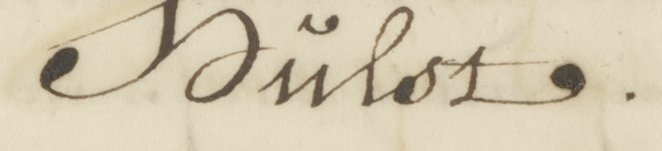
Hulst.
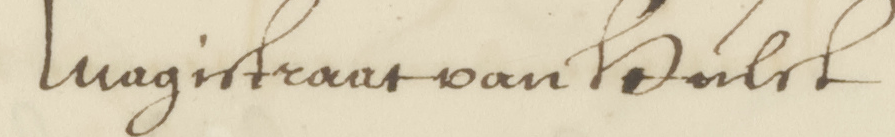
Magistraat van Hulst
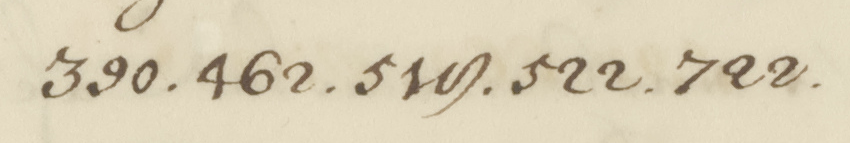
390, 462, 518, 522, 722,
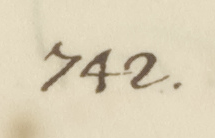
742.
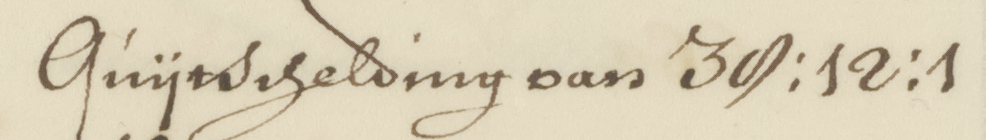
Quijtschelding van 38: 12: 1
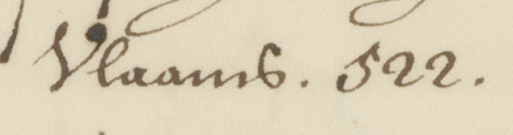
Vlaams 522.
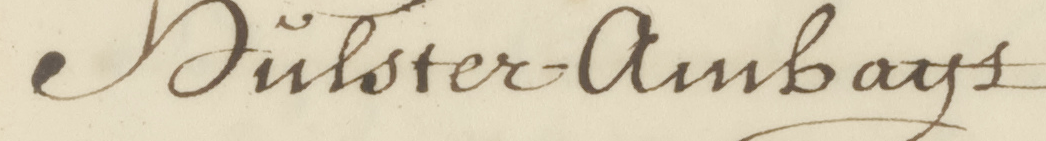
Hulster Ambagt
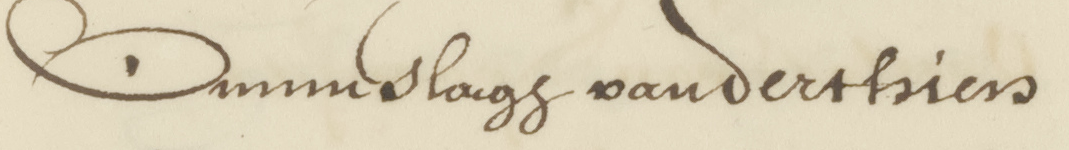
Ommeslagh van derthien
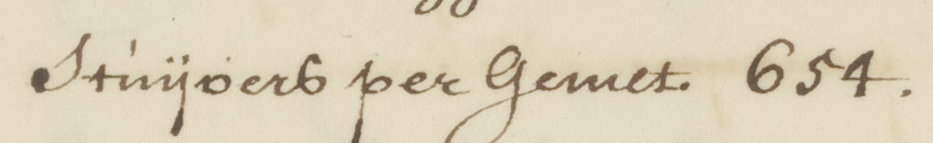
stuijvers per gemet, 654.
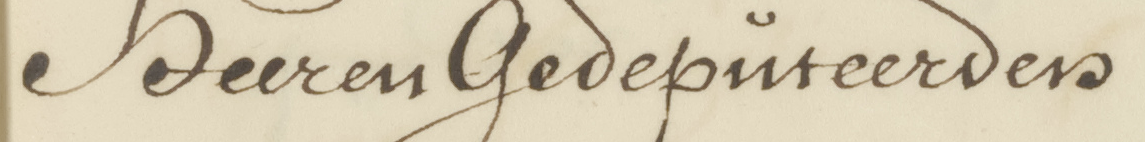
Heeren Gedeputeerden
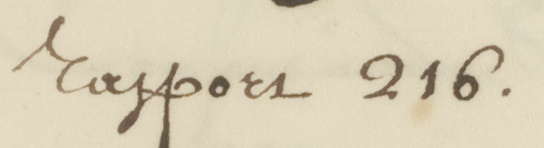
rapport 216.
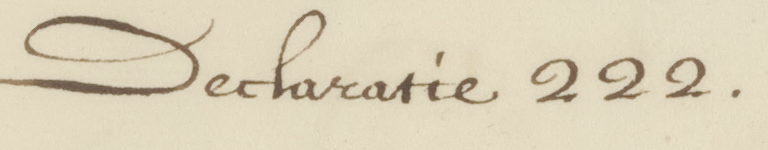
Declaratie 222.
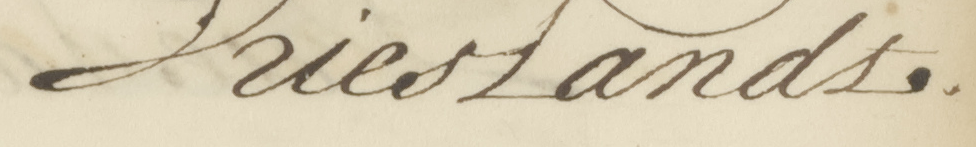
Vrieslandt
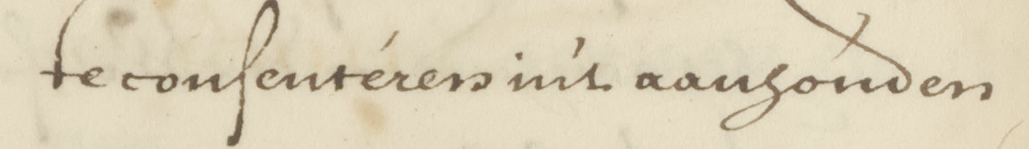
te consenteren in't aanhouden
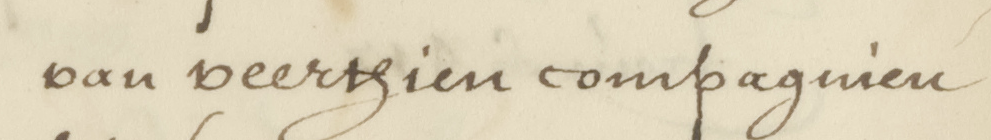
van veerthien compagnien
